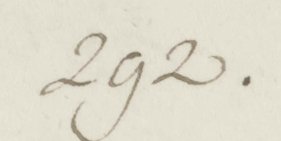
292.
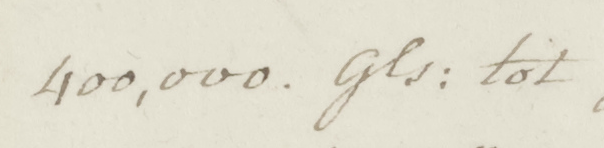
400,000. Gls: tot
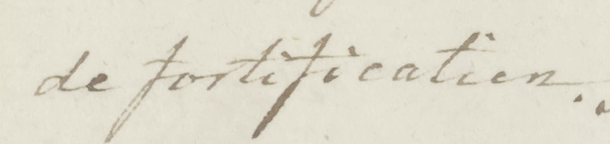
de fortificatien.
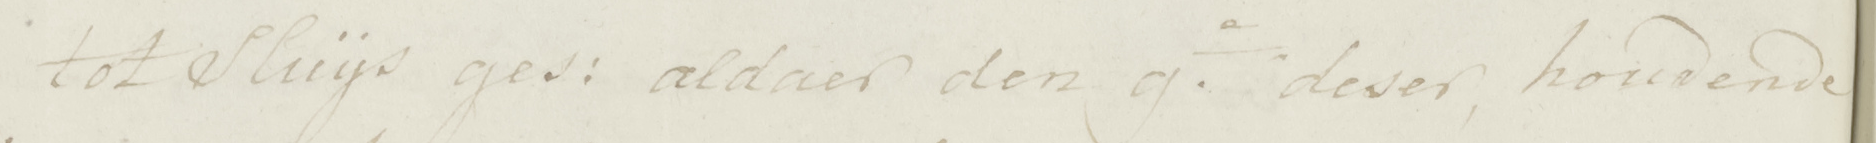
tot Sluijs ges: aldaer den 9e deser, houdende
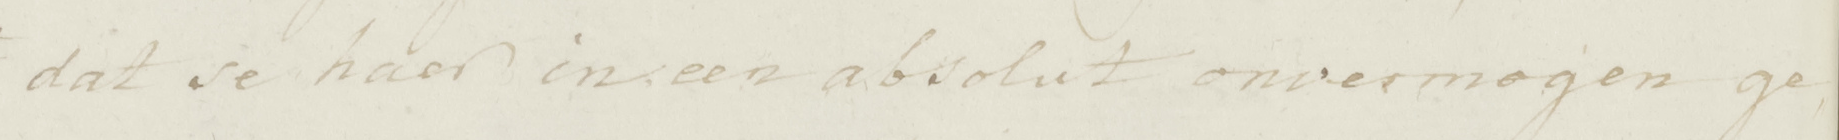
dat se haer in een absolut onvermogen ge„
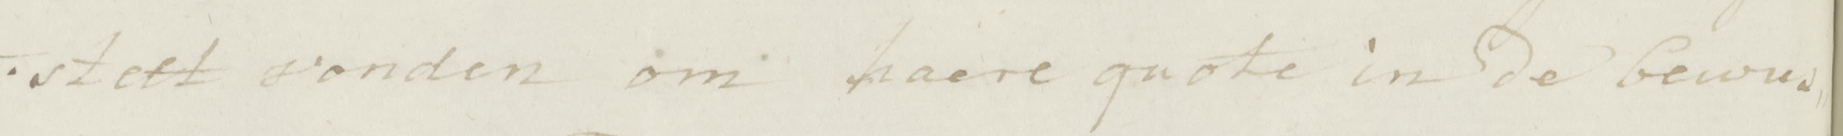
stelt vonden om haere quote in de bewus„
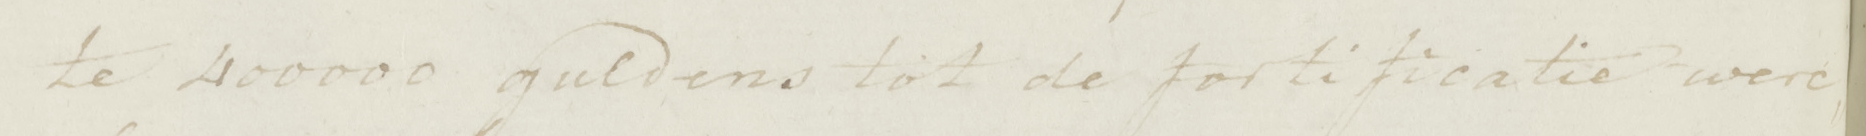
te 400000 guldens tot de fortificatie werc„
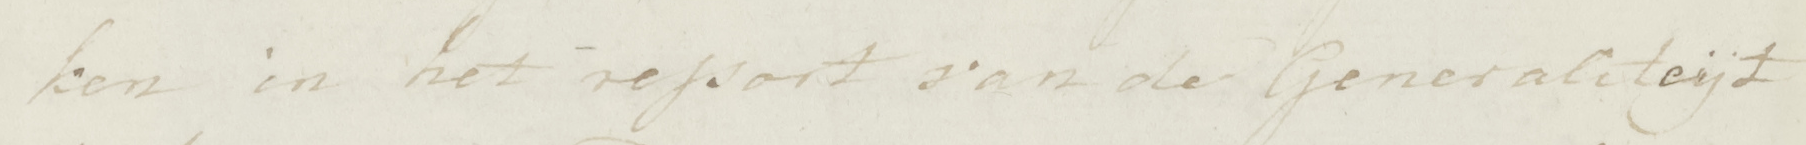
ken in het ressort van de Generaliteijt
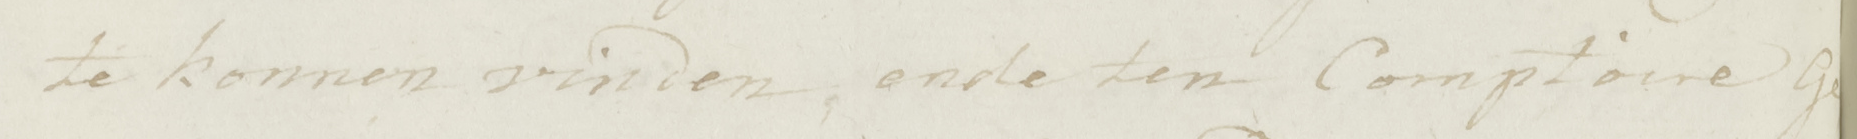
te konnen vinden, ende zen Comptoire Ge
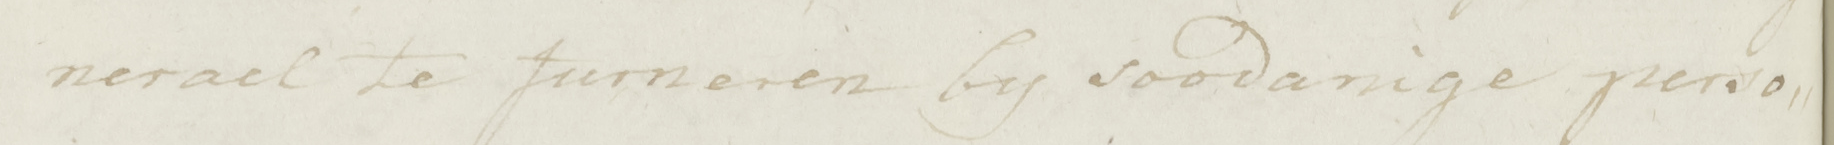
nerael te furneren by soodanige perso„
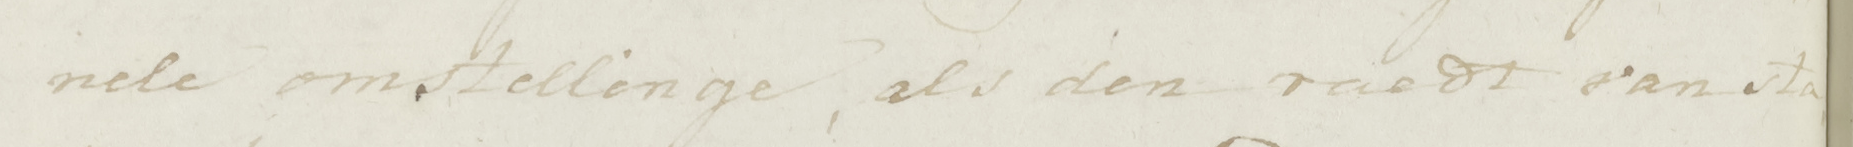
nele omstellinge, als den raedt van sta
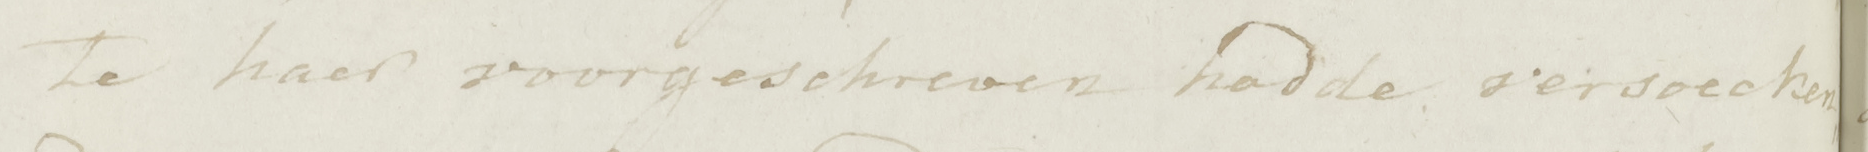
te haer voorgeschreven hadde, versoecken
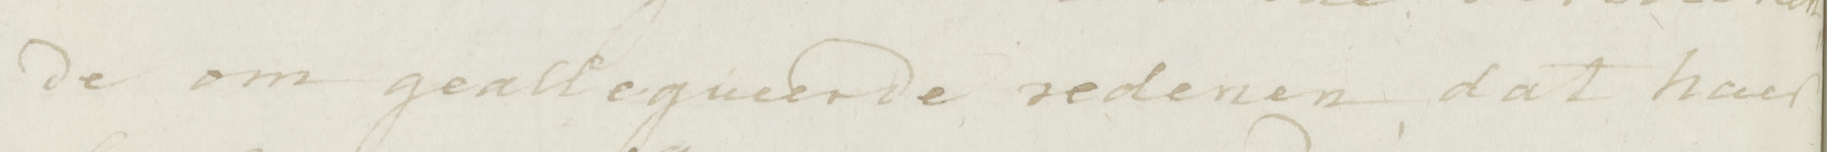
de om geallegueerde redenen, da't haer
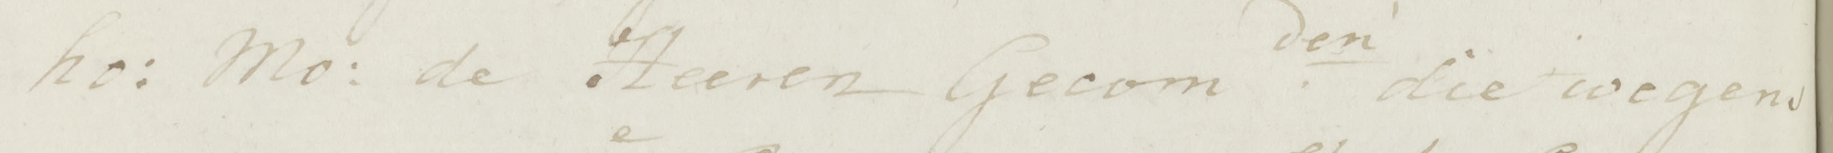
ho: Mo: de Heeren Gecomden. die wegens
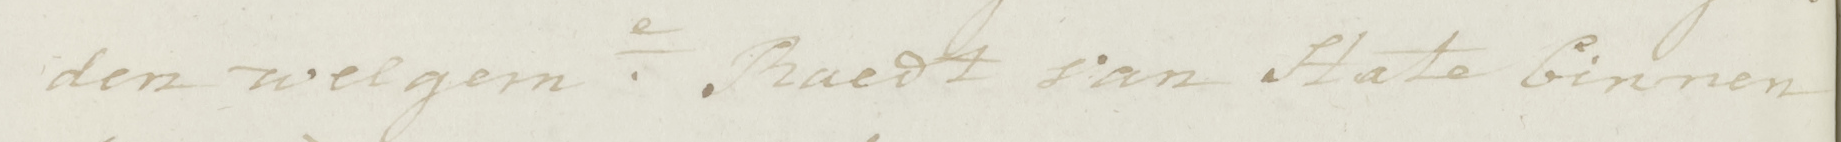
den welgeme. Raedt van State binnen
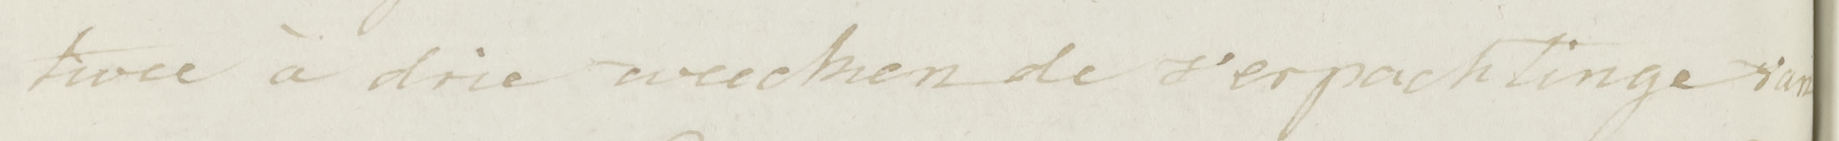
twee à drie weecken de verpachtinge van
